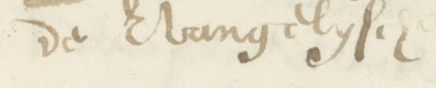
de Evangelijsch
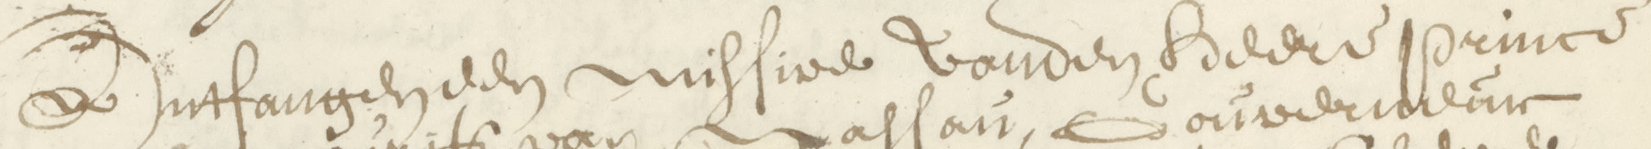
Ontfangen een missive vanden Heere Prince
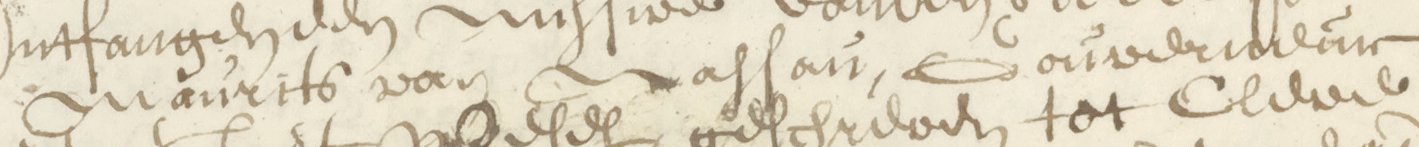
Maurits van Nassau, Gouverneur
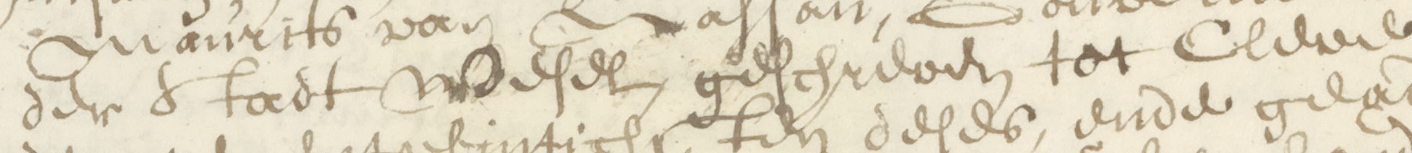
der Stadt Wesel, geschreven tot Cleve
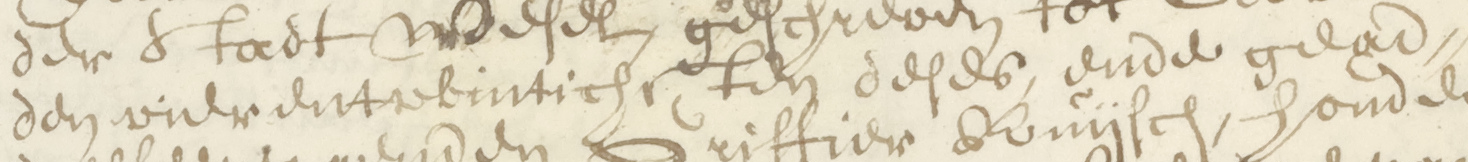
den vierentwintichsten deses, ende gead„
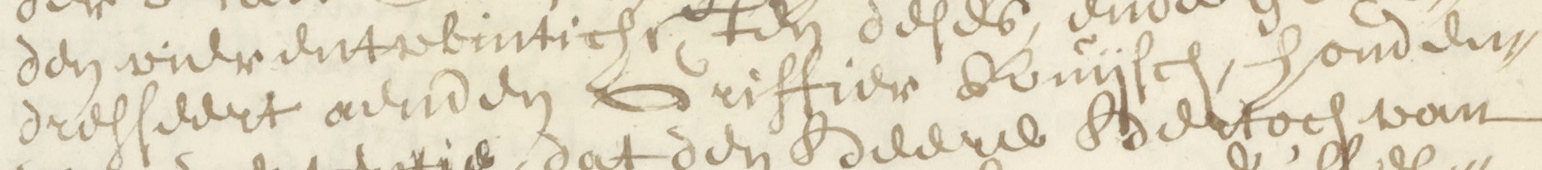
dresseert aenden Griffier Ruijsch, houden„
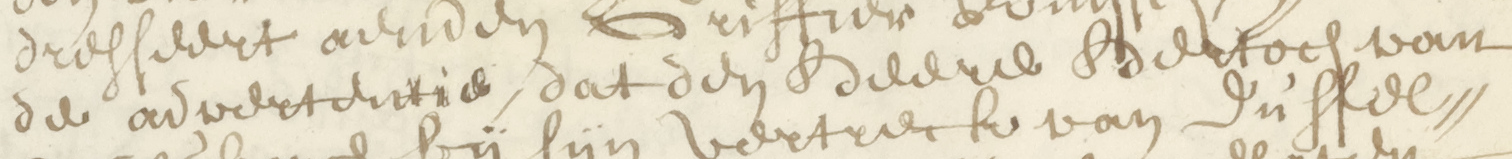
de advertentie, dat den Heere Hertoch van
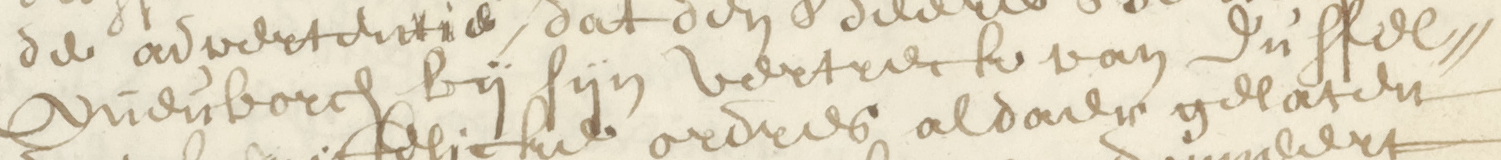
Nieuborch bij sijn vertreck van Dussel„
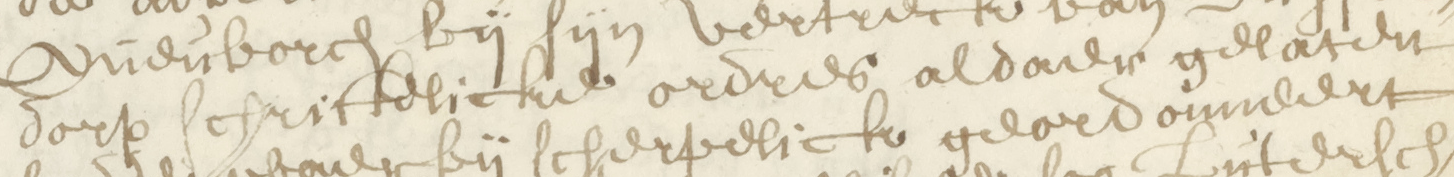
dorp schriftelicke ordres aldaer gelaten
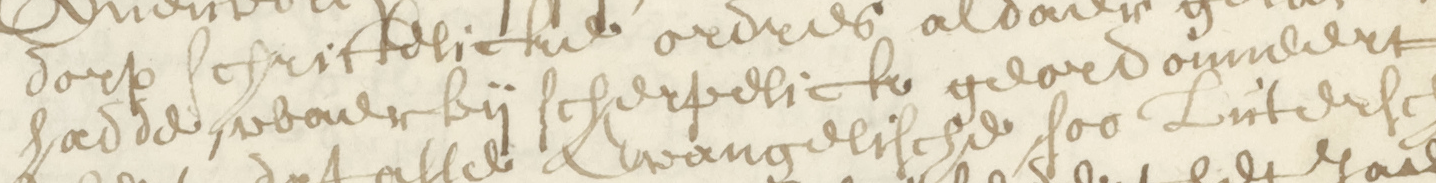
hadde, waer bij scherpelick geordonneert
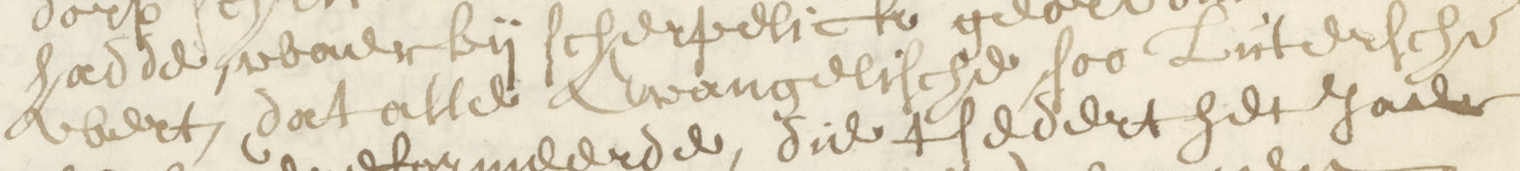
wert, dat alle Evangelische, soo Lutersche
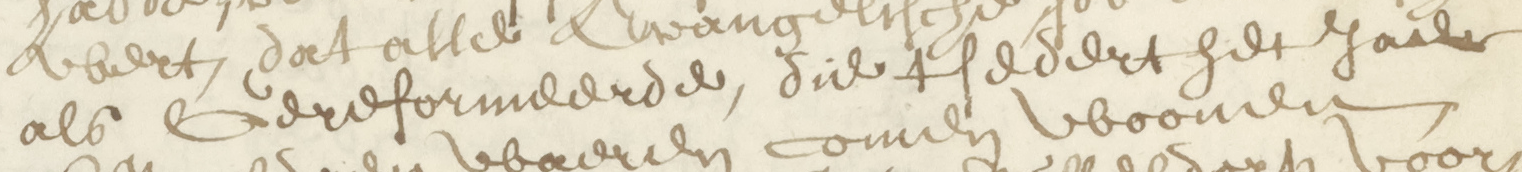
als Gereformeerde, die tsedert het Jaer
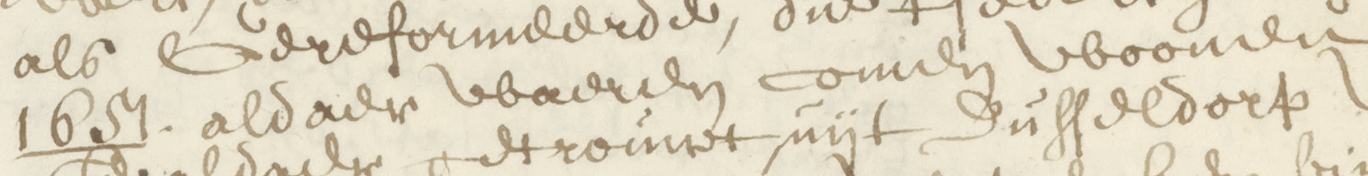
1651 aldaer waeren comen woonen,
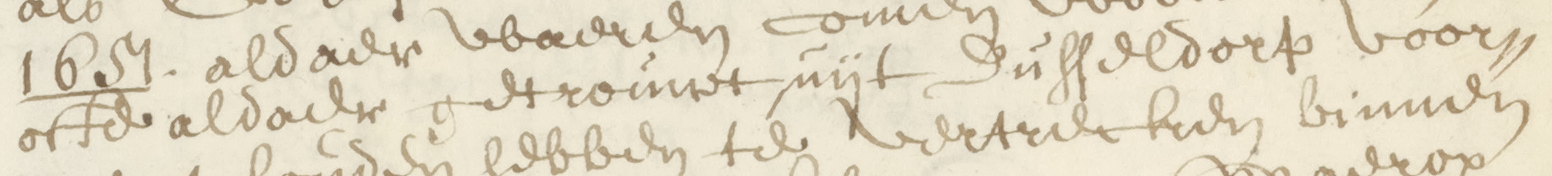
offe aldaer getrouwt uijt Dusseldorp voor„
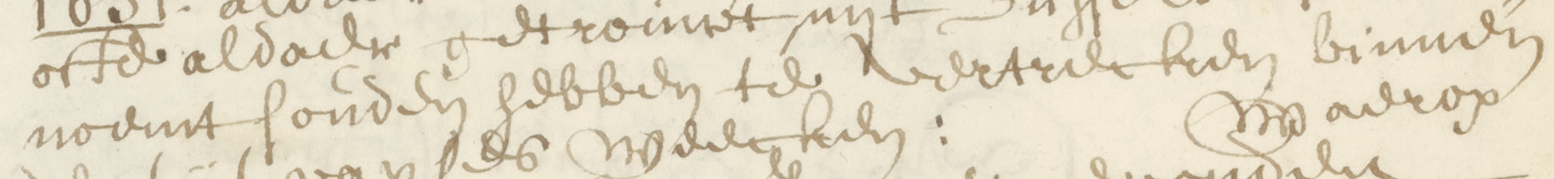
noemt souden hebben te vertrecken binnen
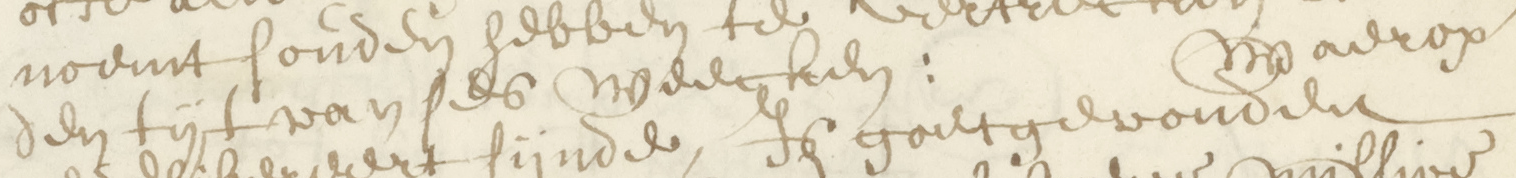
den tijt van ses Weecken: Waerop
